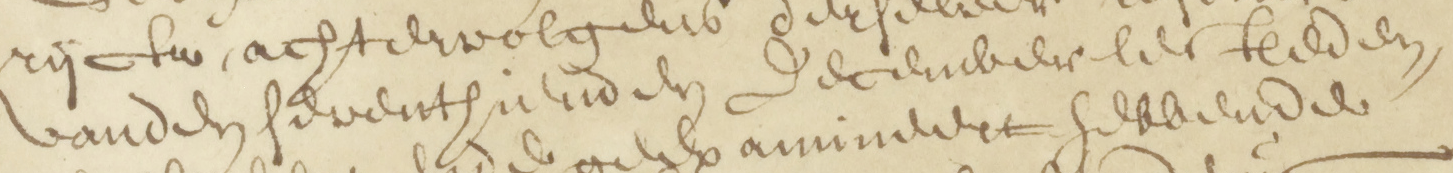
vanden seventhienden December lestleden,
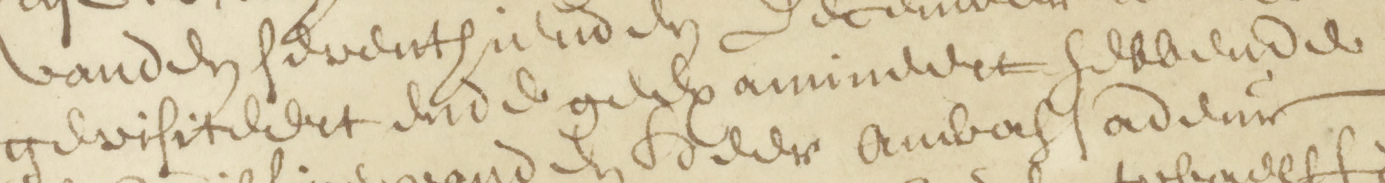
gevisiteert ende geexamineert hebbende
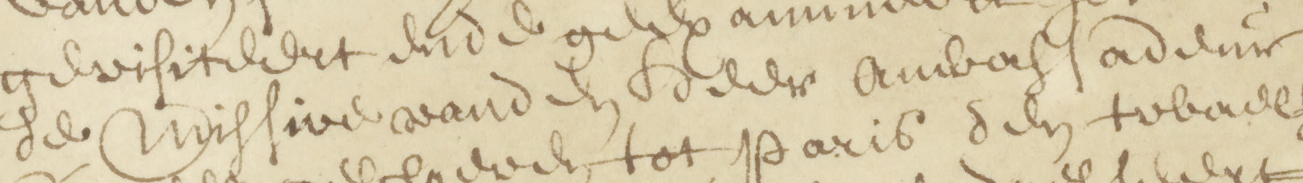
de Missive vanden Heer Ambassadeur
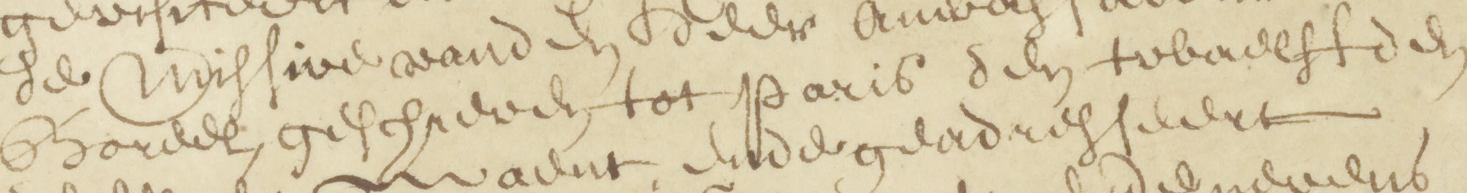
Boreel, geschreven tot Paris den twaelffden
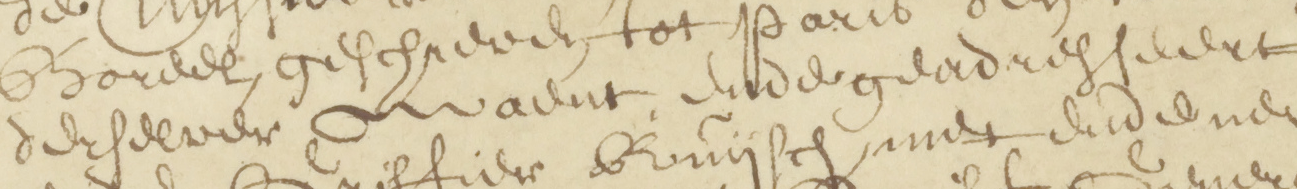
derselver Maent ende geadresseert
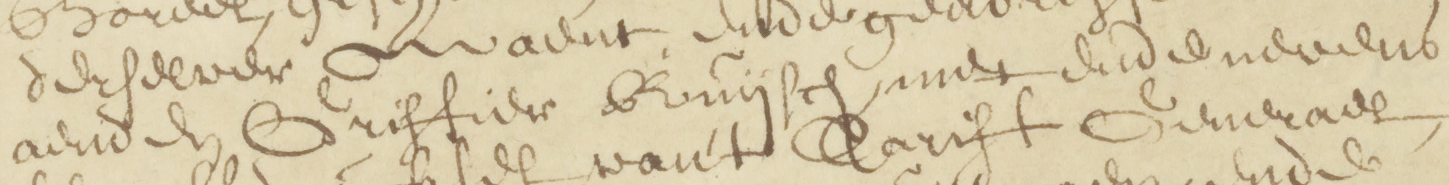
aenden Griffier Ruijsch, met ende nevens
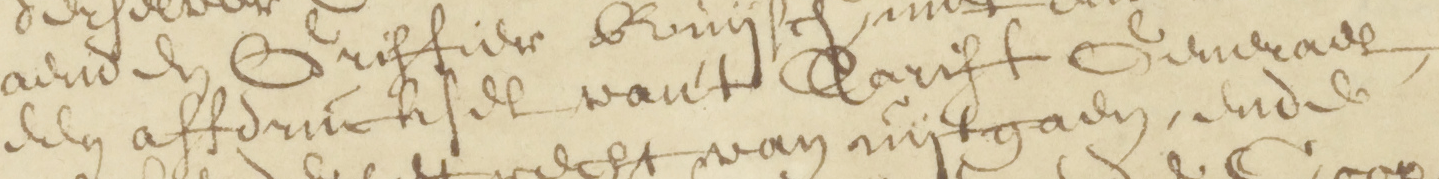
een affdrucksel vant' Tariff Generael,
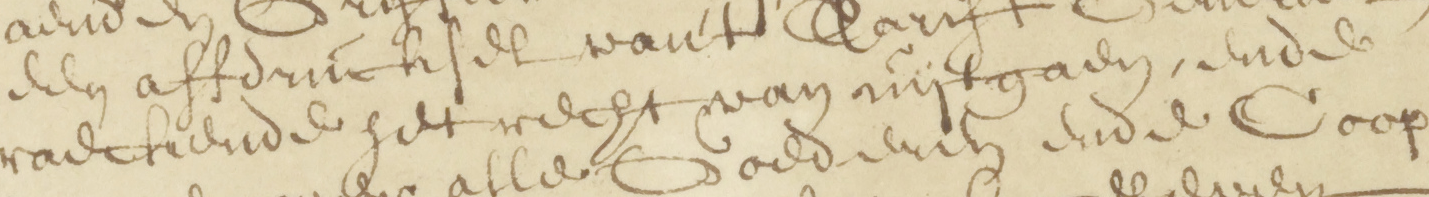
raeckende het recht van uijtgaen, ende
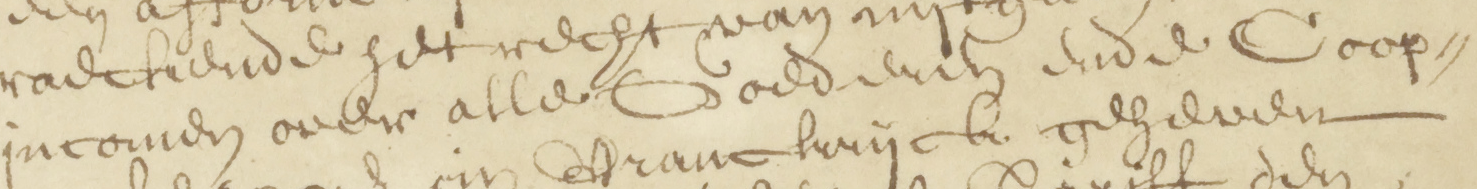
incomen over alle Goederen ende Coop„
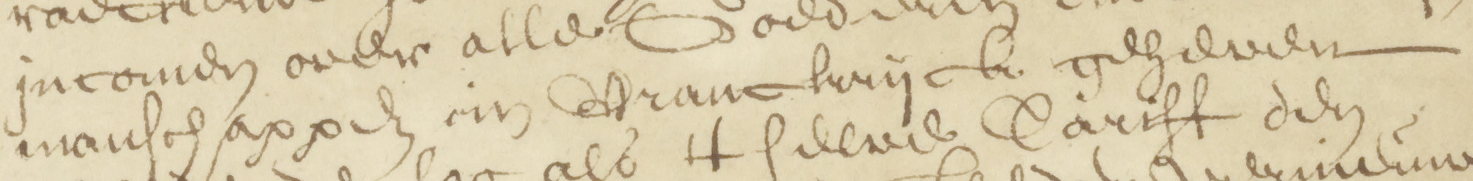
manschappen in Vranckrijck geheven
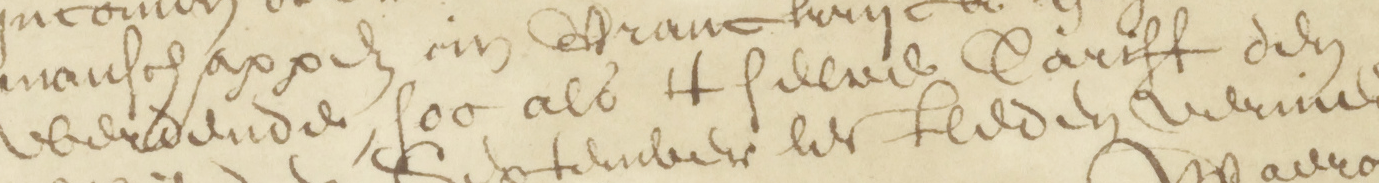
werdende, soo als 't selve Tariff den
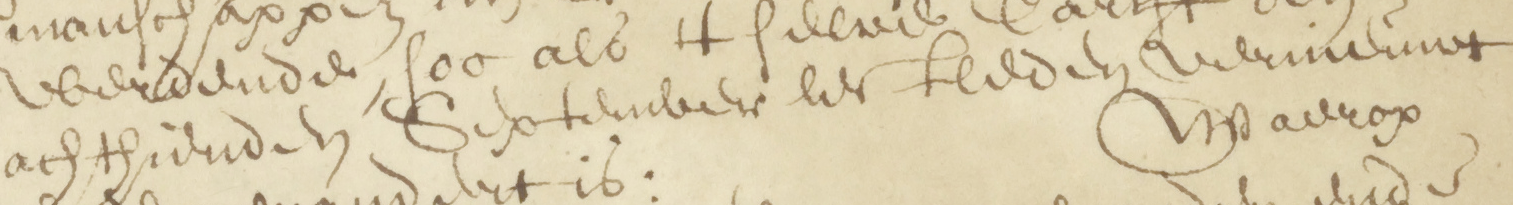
achthienden September lestleden vernieuwt
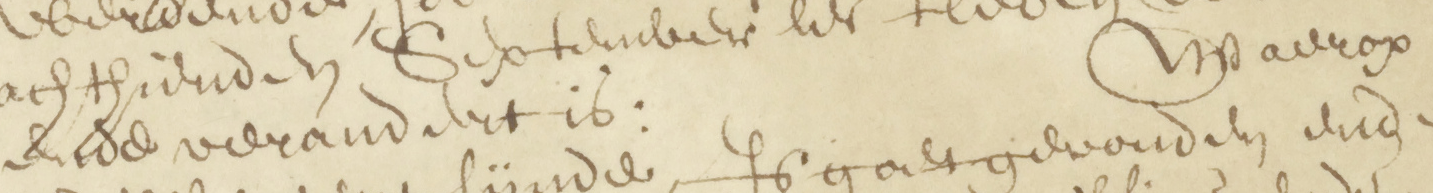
ende verandert is. Waerop
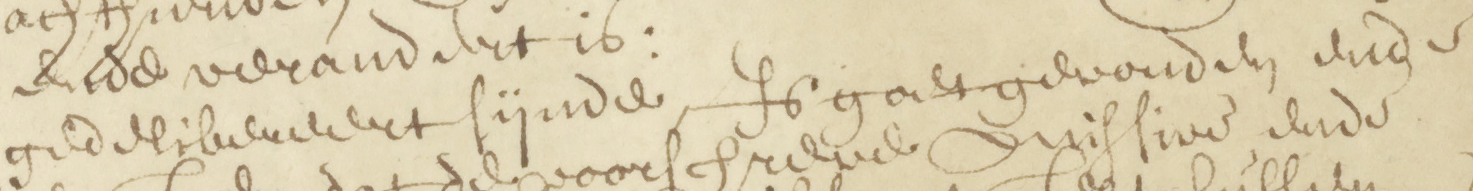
gedelibereert sijnde, Is goetgevonden ende
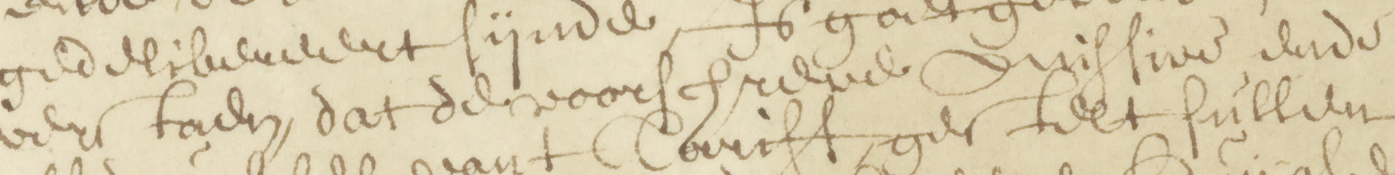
verstaen, dat de voorschreve Missive ende
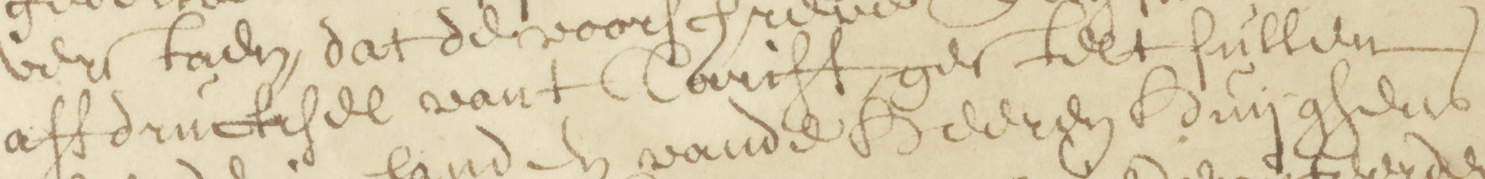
affdrucksel vant Tariff gestelt sullen
